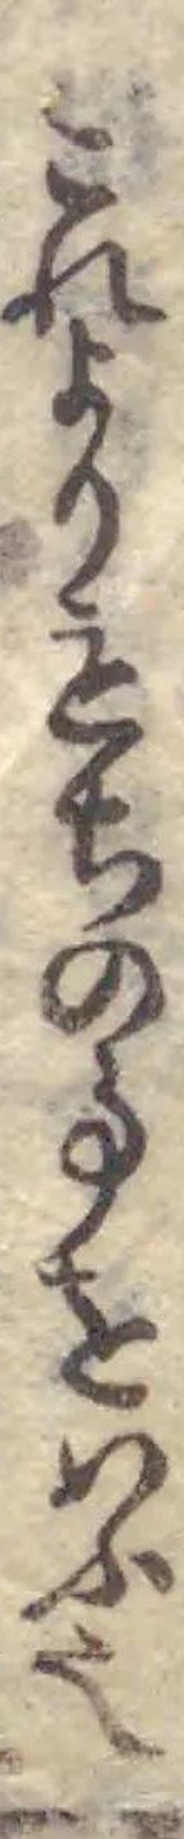これよりもちの事をいふ也
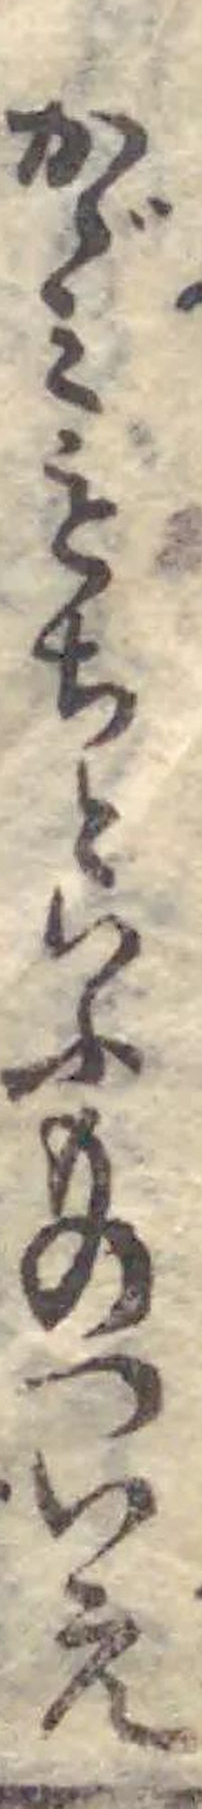かゞみもちといふものついえ
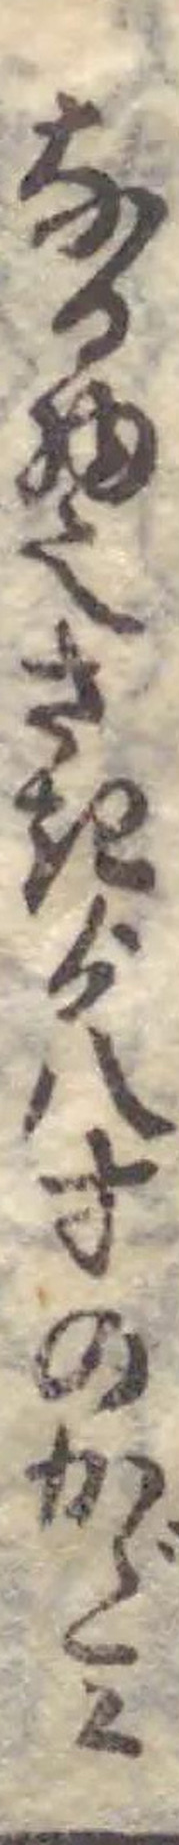なる物也さきより八寸のかゞみ
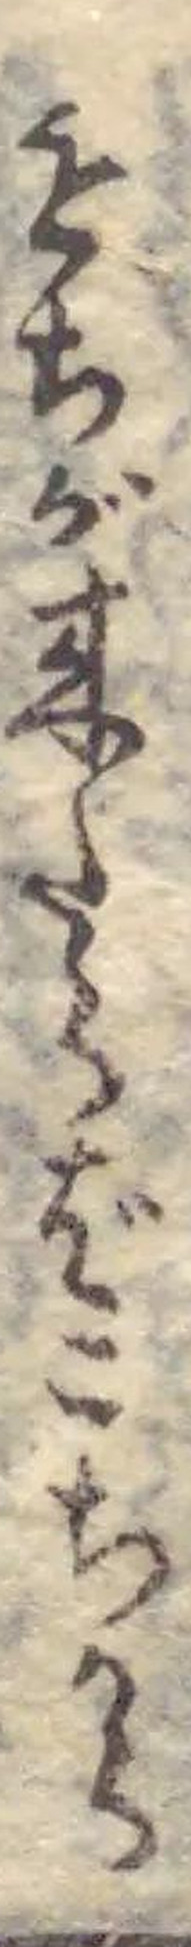もちが来たらばこちから
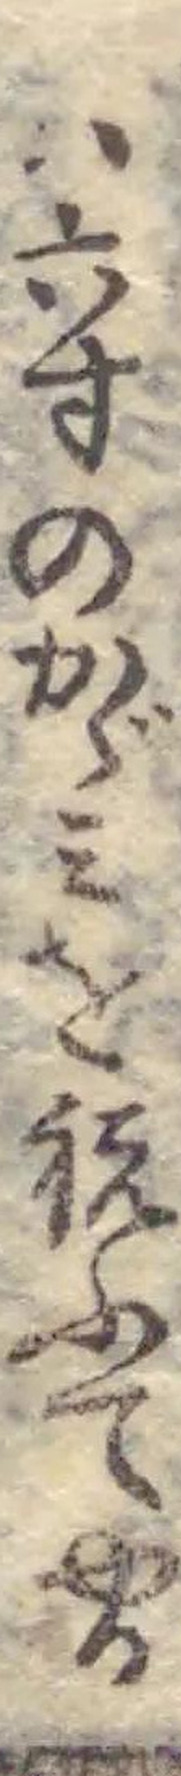は六寸のかゞみをいわふてやる
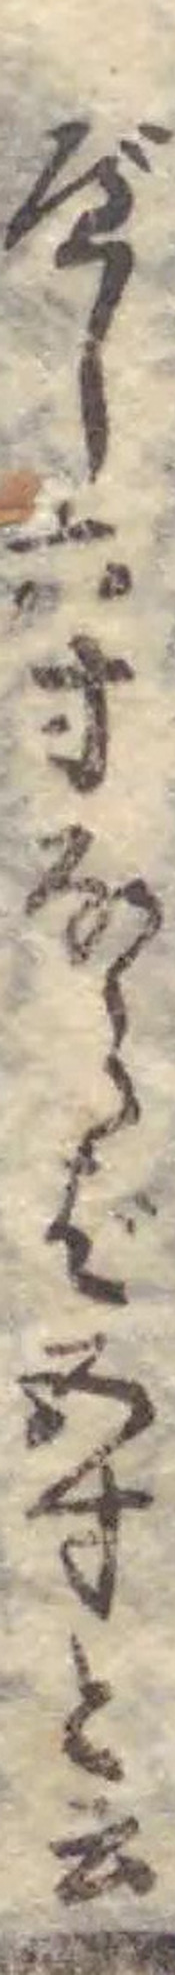べし六寸ならば五寸と云
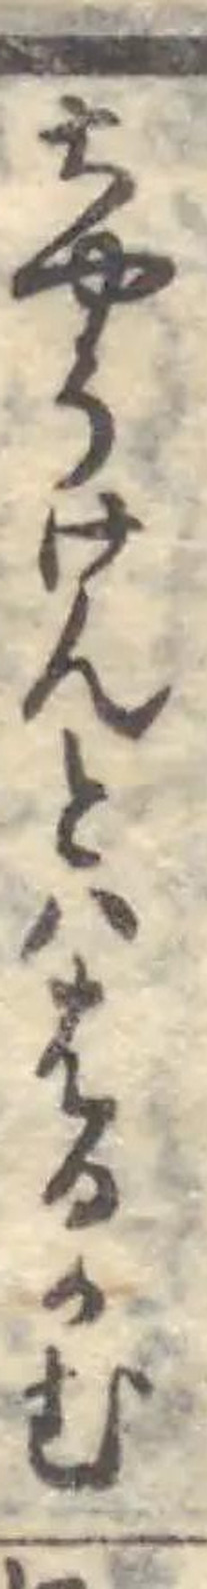ちやうけんとははるかむ
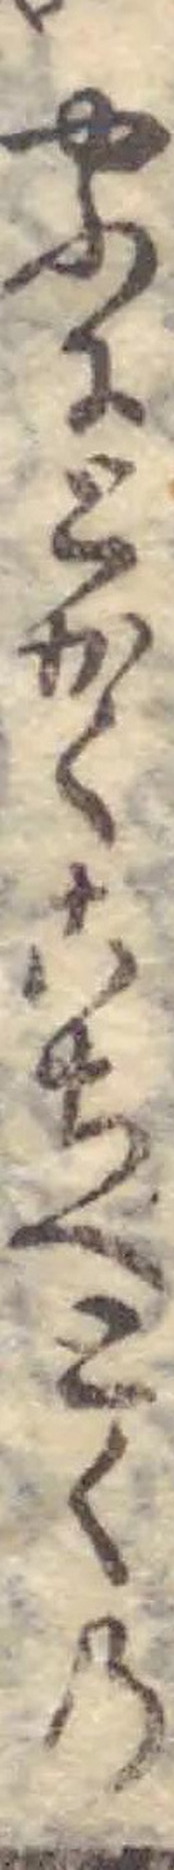やふにとかくこちへとくの
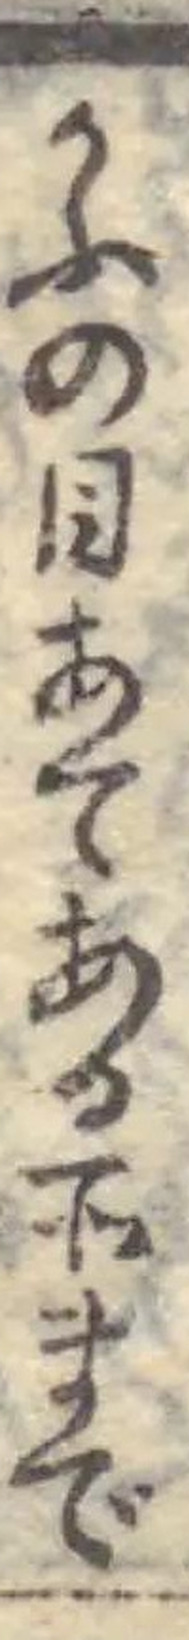かふの目あてある所まで
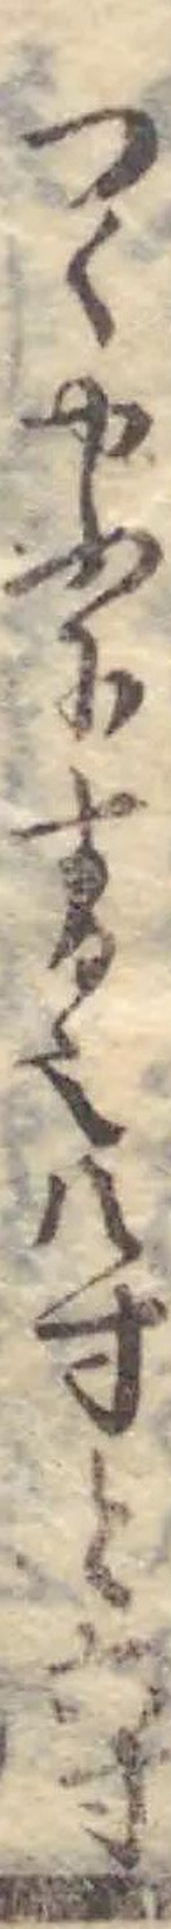つくやふにする事八寸と六寸
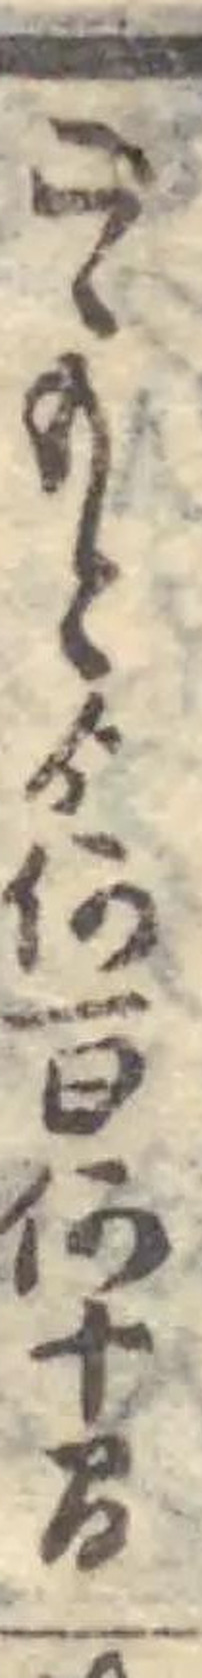こゝもとより何百何十間
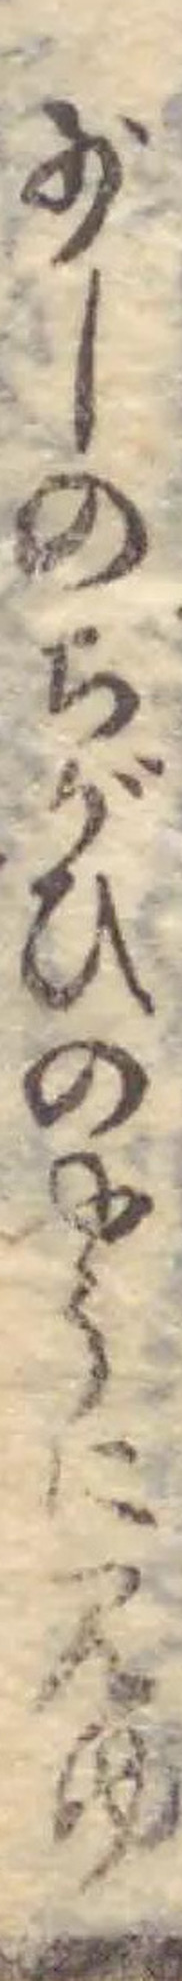少しのちがひのやうに見ゆ
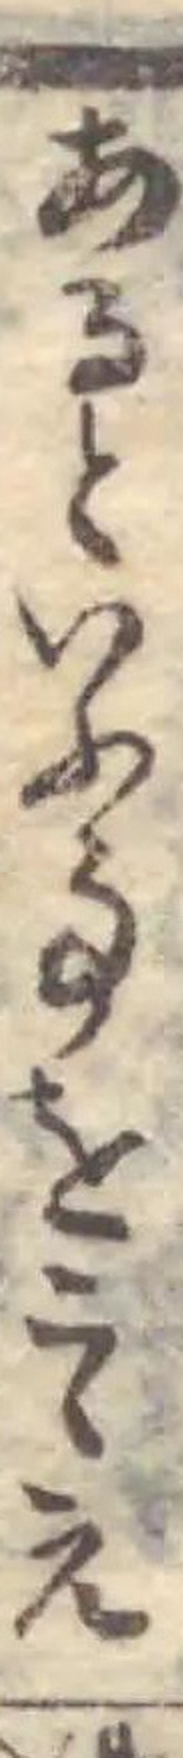あるといふ事をこゝ元
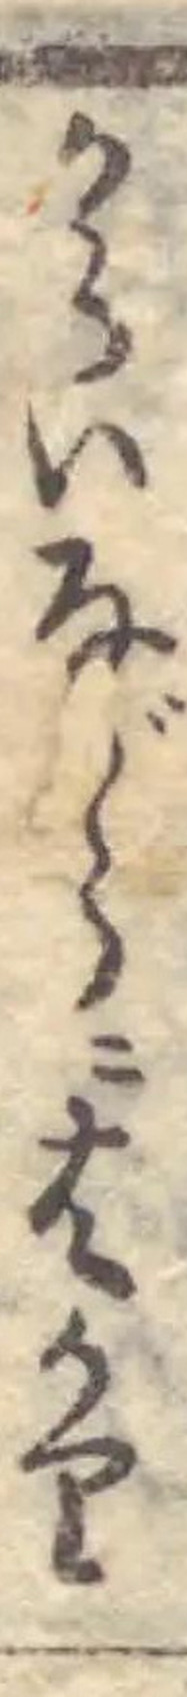からいながらにはかり
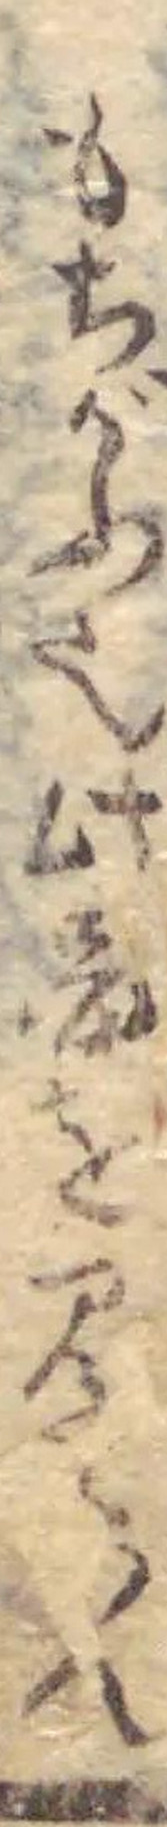もちがふ也此図を見てかん
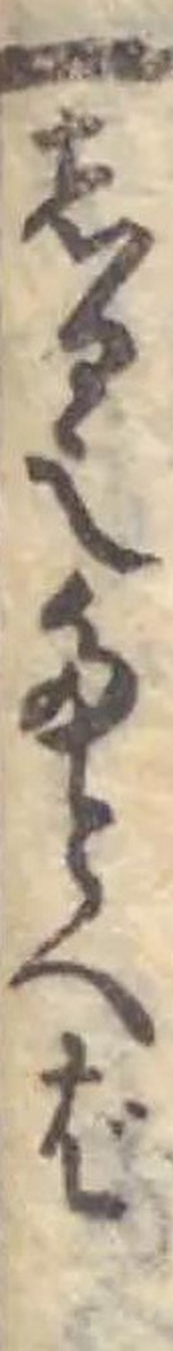しる也たとへば
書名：大通人好記
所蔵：国立国会図書館 National Diet Library, JAPAN
